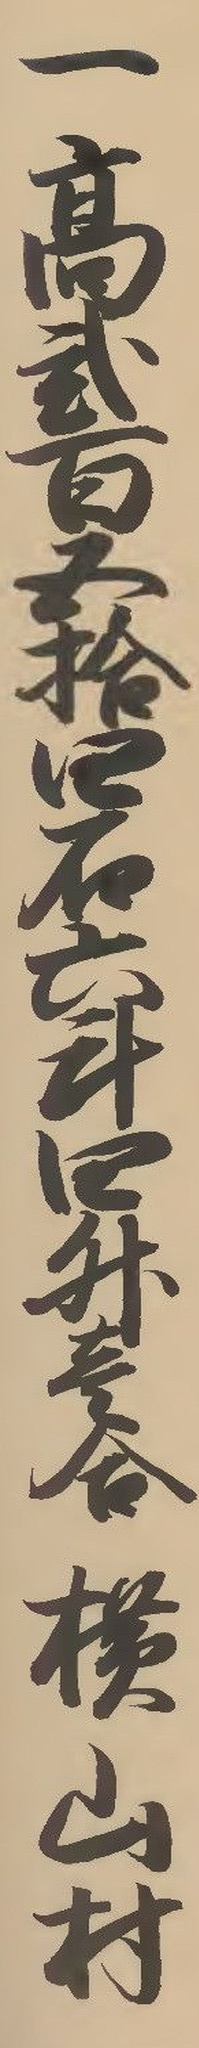一高弐百五拾四石六斗四升壱合横山村
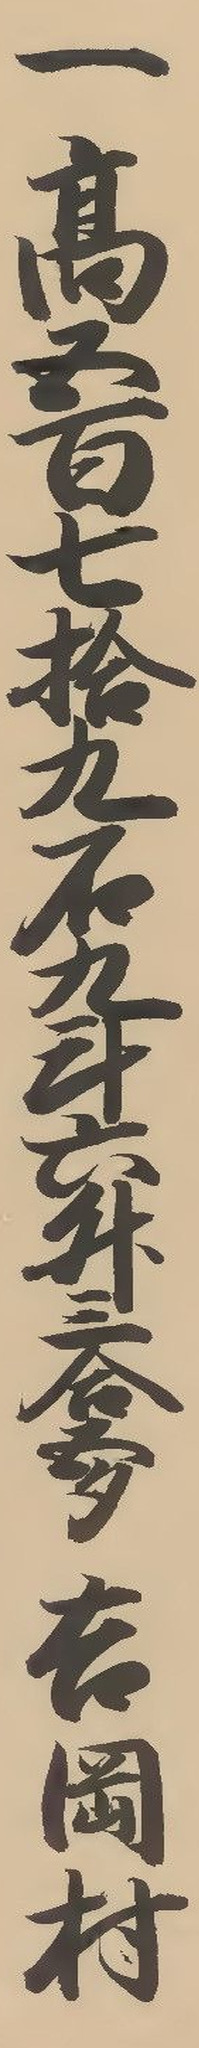一高五百七拾九石九斗六升三合五勺吉岡村
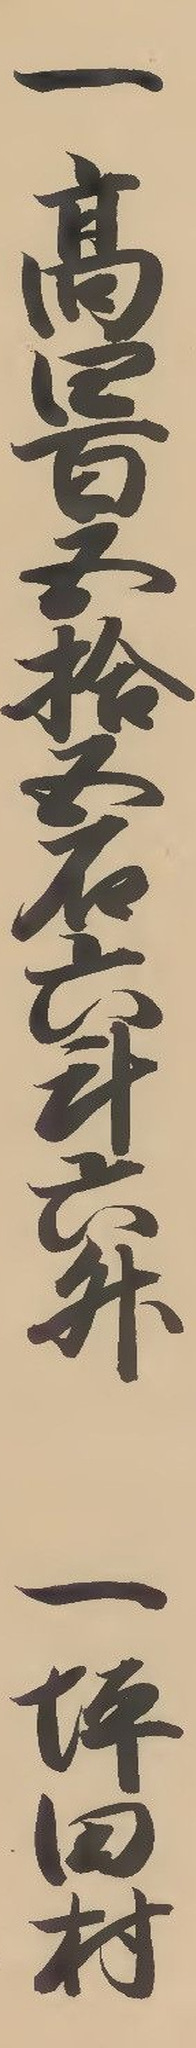一高四百五拾五石六斗六升一坪田村

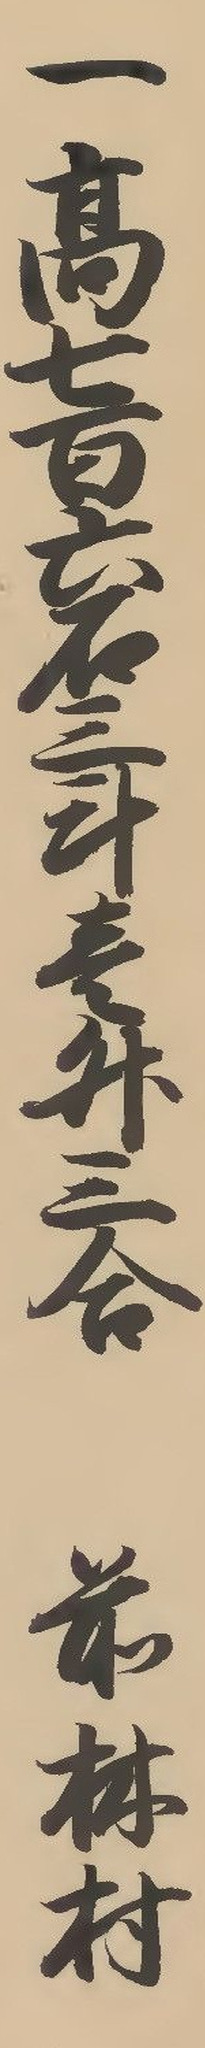一高七百六石三斗壱升三合前林村
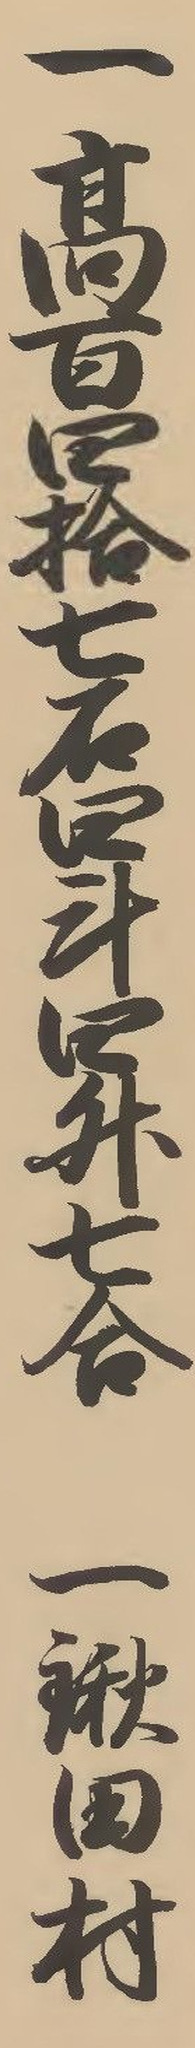一高百四拾七石四斗四升七合一鍬田村
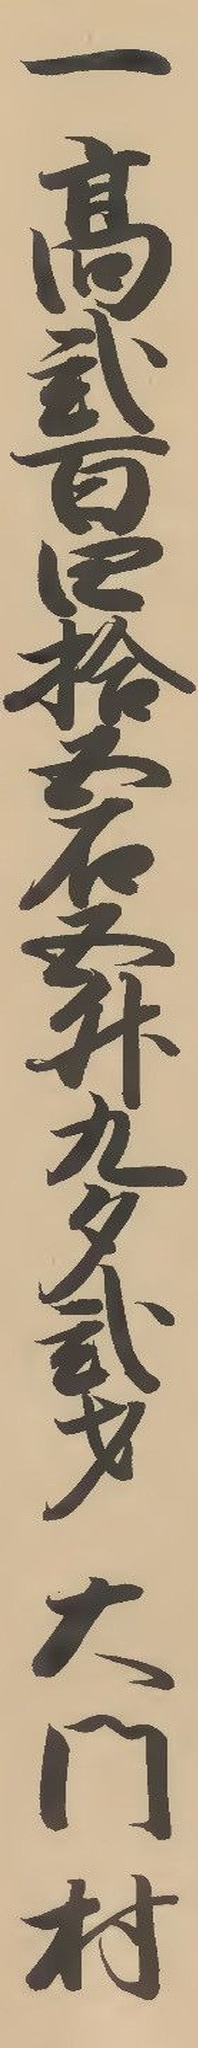一高弐百四拾五石五升九勺弐才大門村
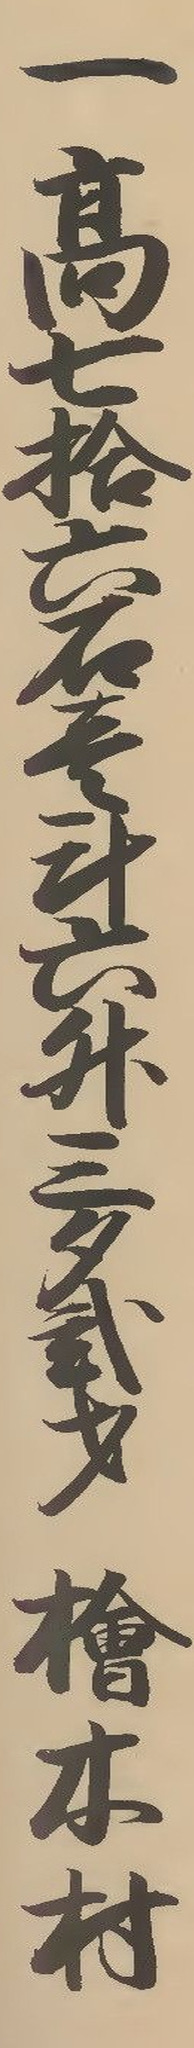一高七拾六石壱斗六升三勺弐才桧木村
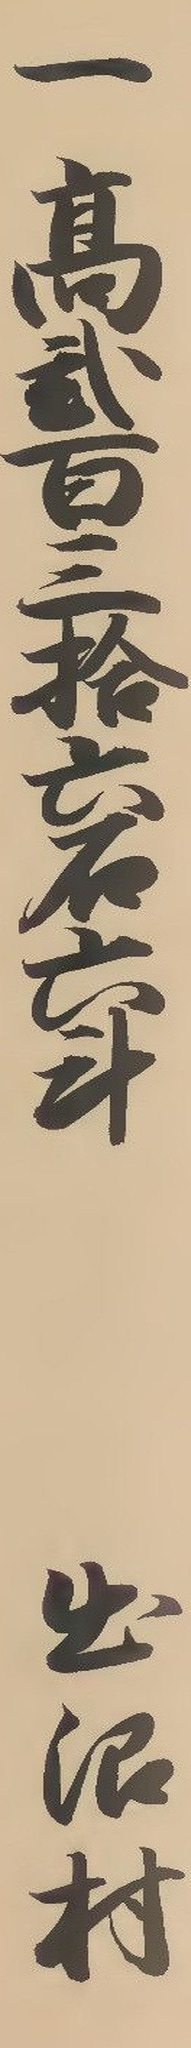一高弐百三拾六石六斗出沼村
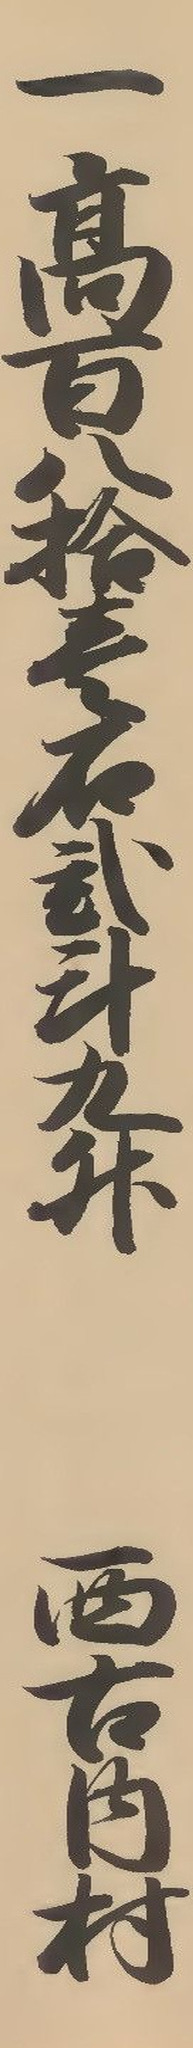一高百八拾壱石弐斗九升西古内村
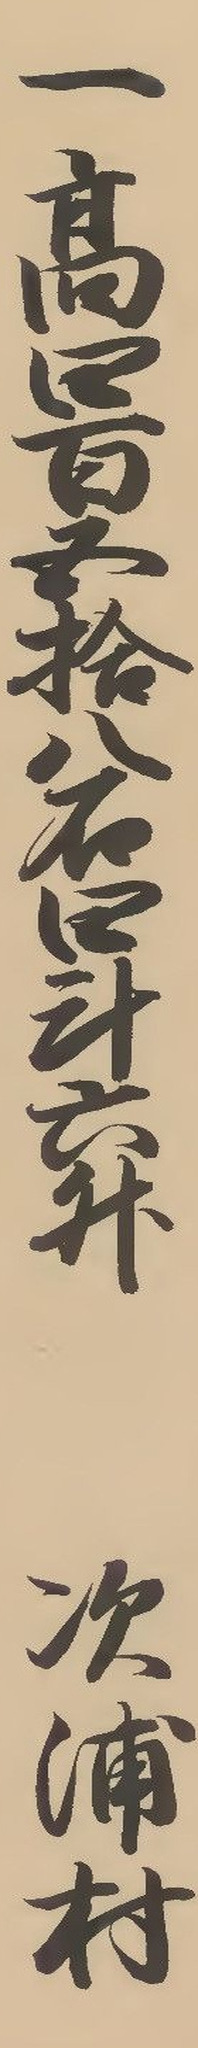一高四百五拾八石四斗六升次浦村
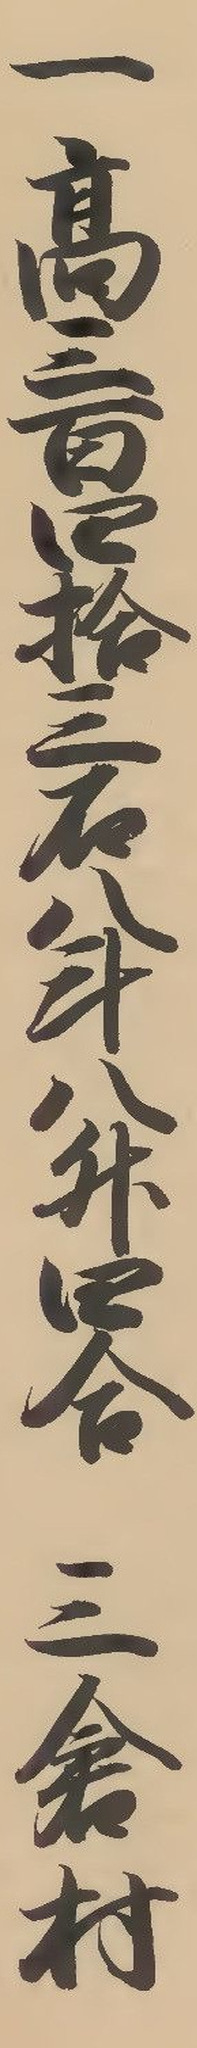一高三百四拾三石八斗八升四合三倉村

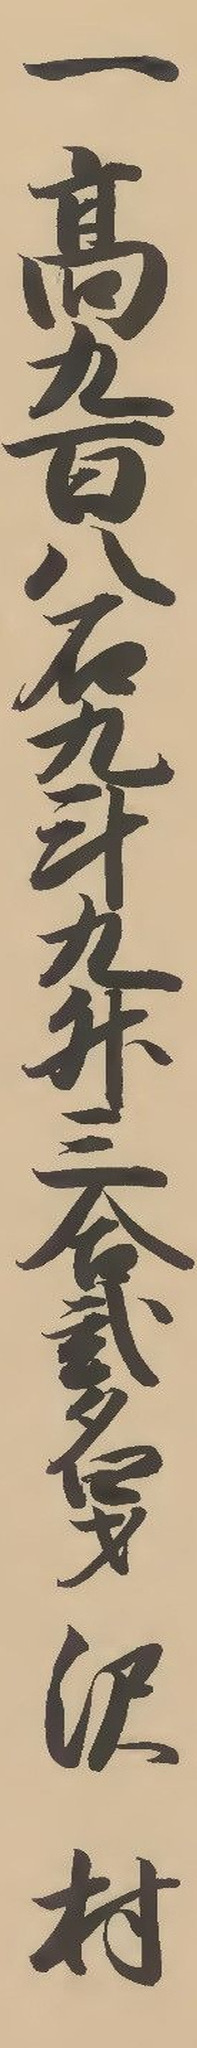一高九百八石九斗九升三合弐勺四才沢村
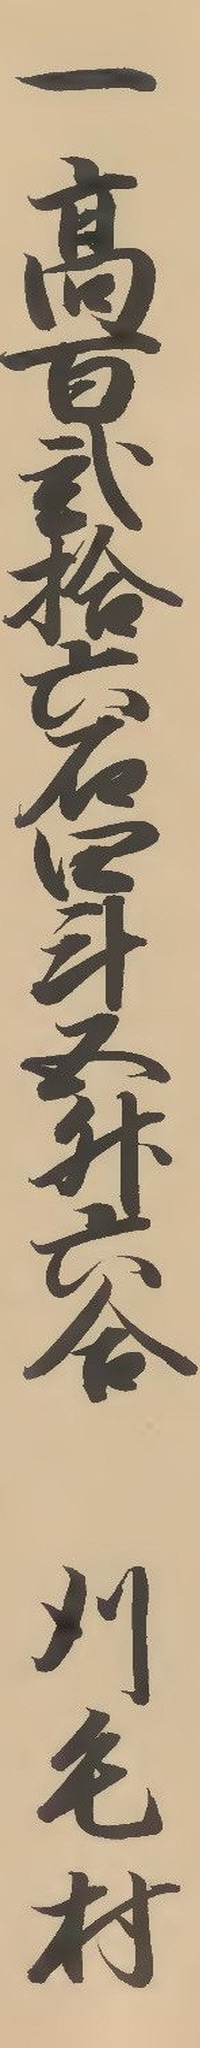一高百弐拾六石四斗五升六合刈毛村
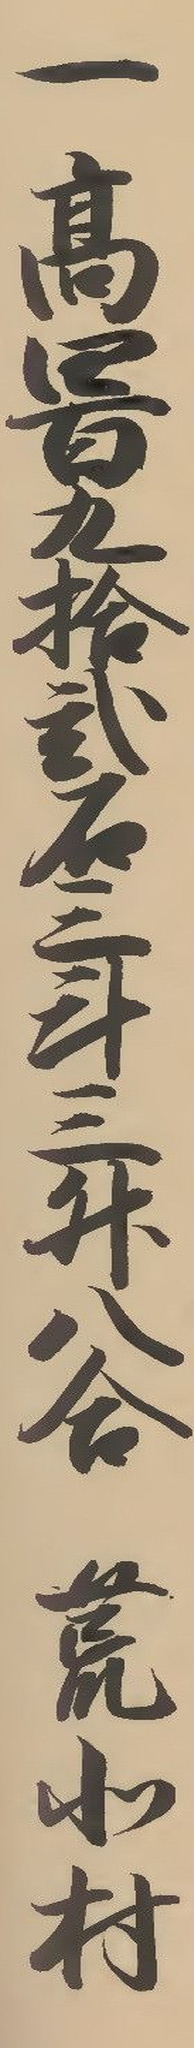一高四百九拾弐石三斗三升八合荒北村
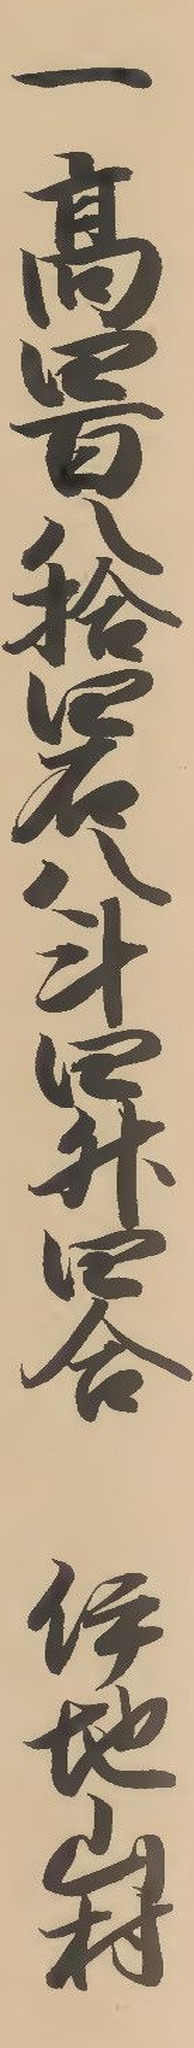一高四百八拾四石八斗四升四合伊地山村
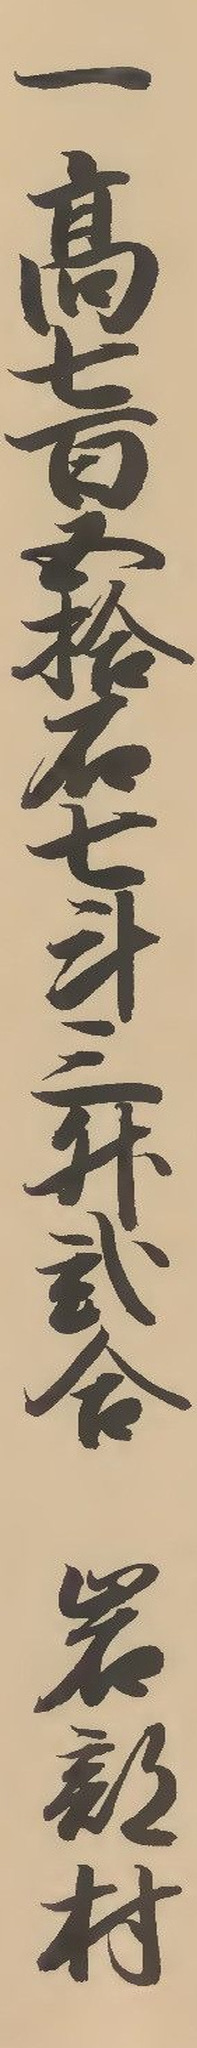一高七百五拾石七斗三升弐合岩部村
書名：下総国郷帳
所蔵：国立公文書館 National Archives of Japan
